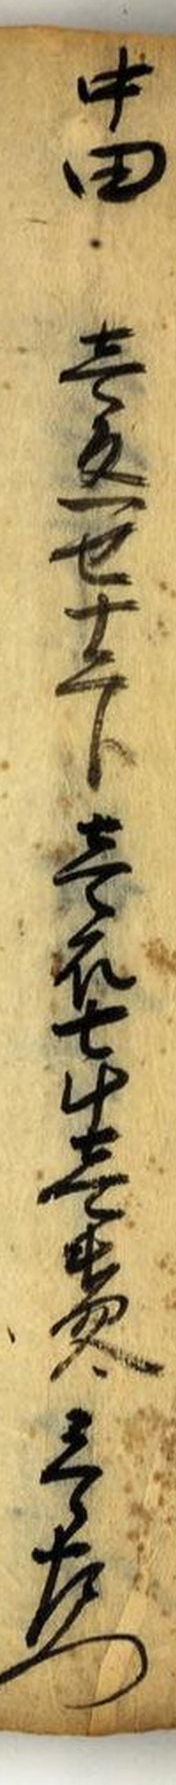中田壱反一セ十二分壱石七斗壱升四合三郎左衛門
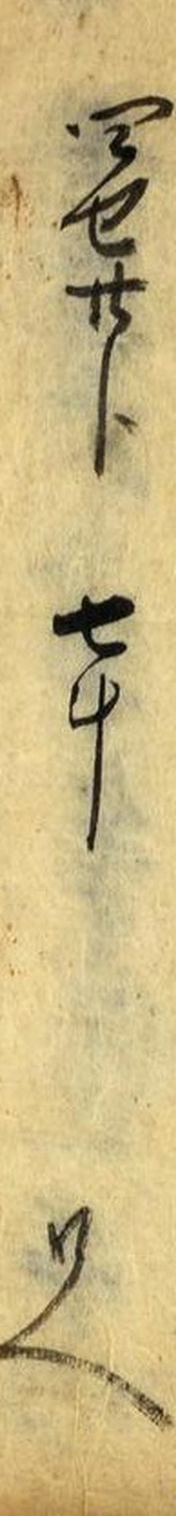同四セ廿分七斗同人
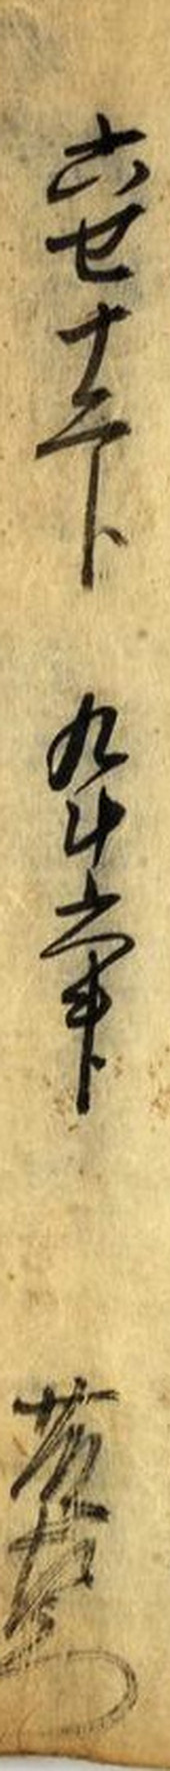同六セ十二分九斗六升藤左衛門
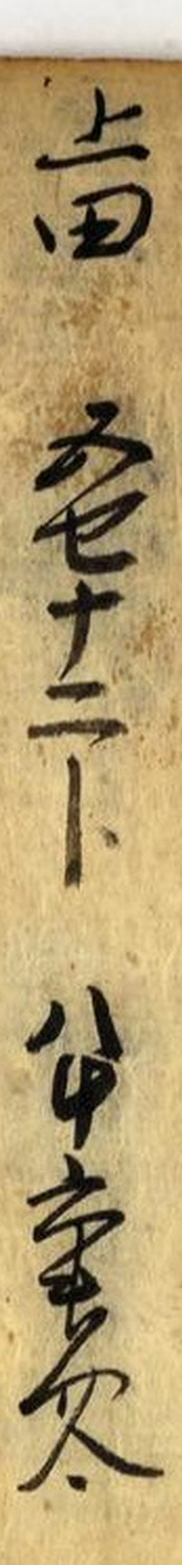上田五セ十二分八斗六升四合同人
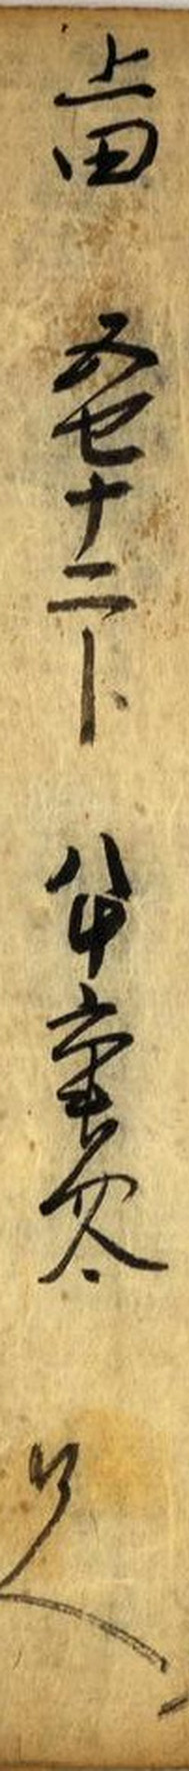上田五セ十二分八斗六升四合同人
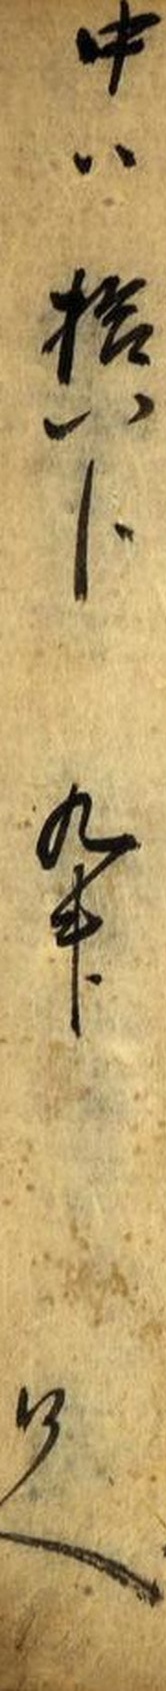中同拾八分九斗同人
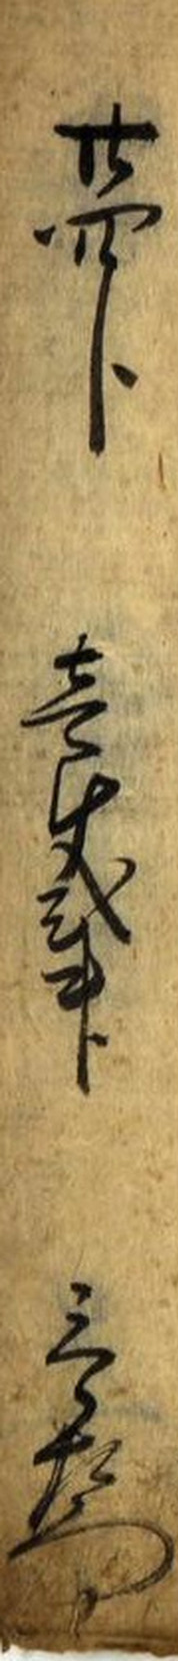同廿四分壱斗弐升三郎左衛門

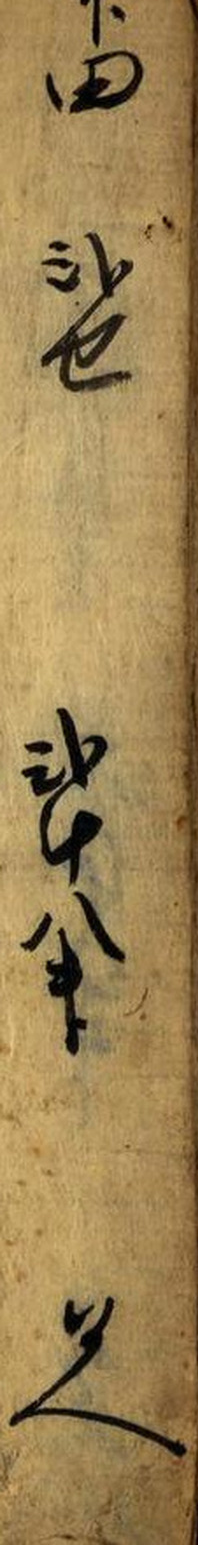下田弐セ弐斗八升同人
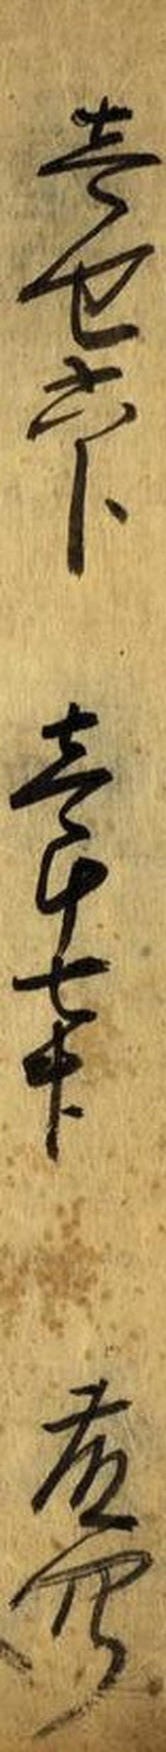同壱セ六分壱斗七升藤四郎
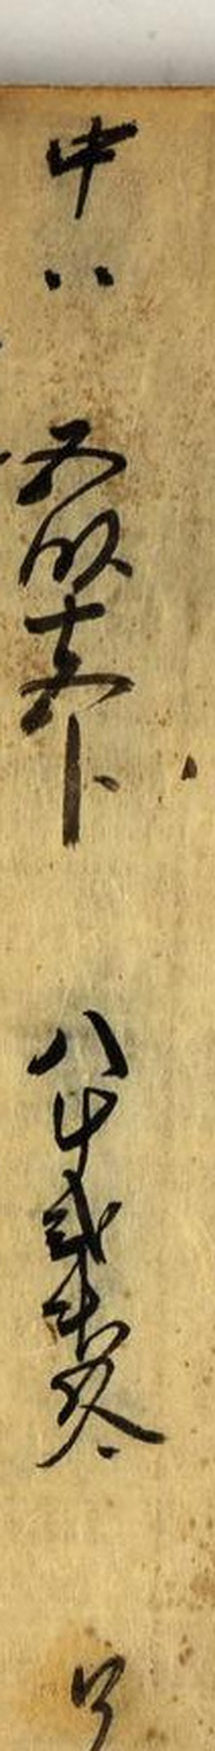中同五畝十五分八斗弐升五合同人
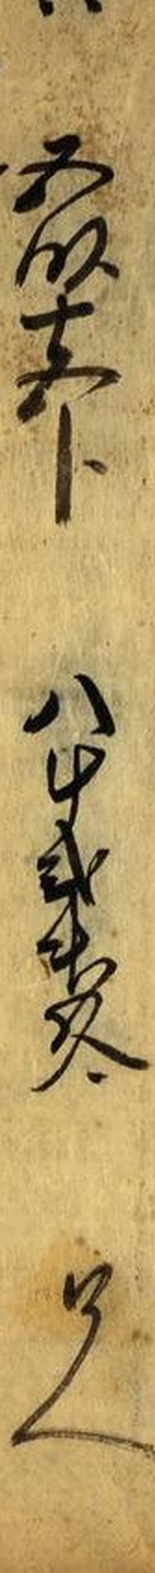中同五畝十五分八斗弐升五合同人
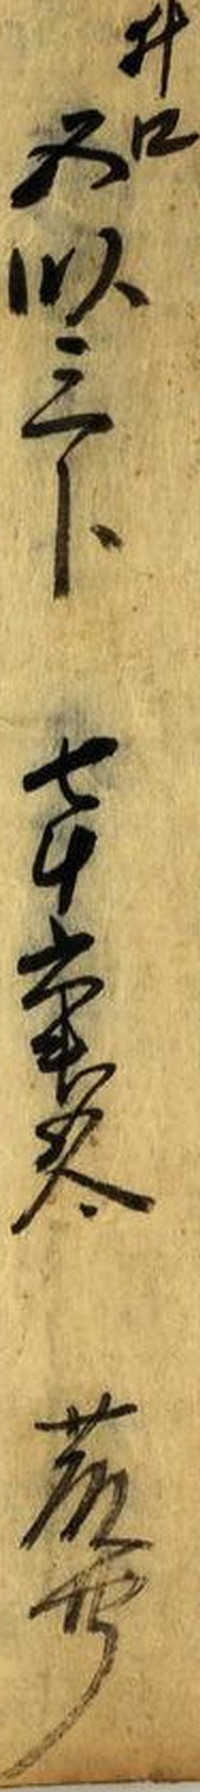同五畝三分七斗六升五合藤四郎
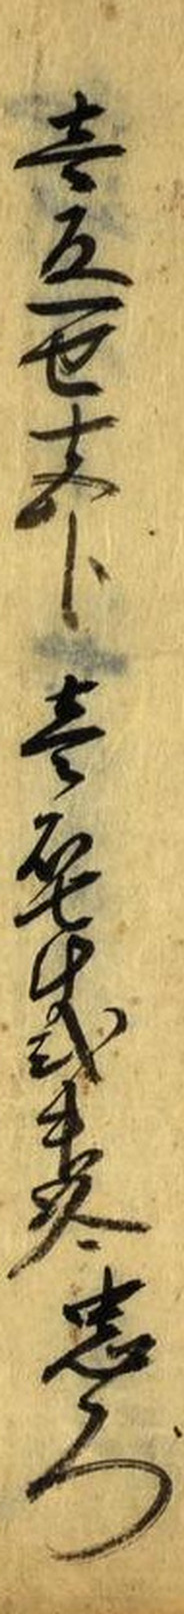同壱反一セ十五分壱石七斗弐升五合忠右衛門
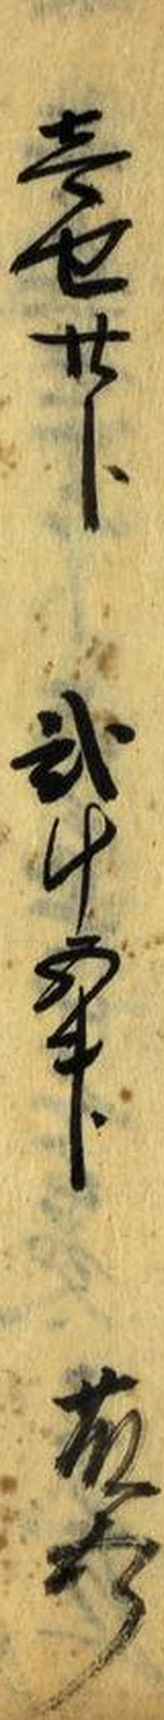同壱セ廿分弐斗五升藤五郎
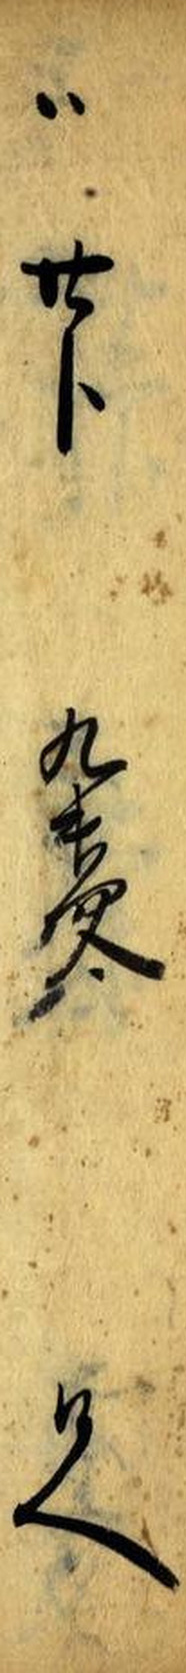同廿分九升四合同人
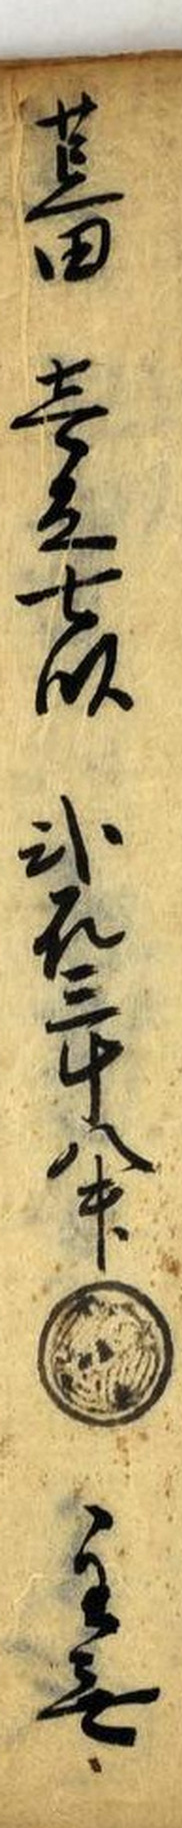荒田壱反七畝弐石三斗八升㊞主無
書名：越前国西方内志津庄内本折村御検地帳
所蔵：福井県文書館 Fukui Prefectural Archives
